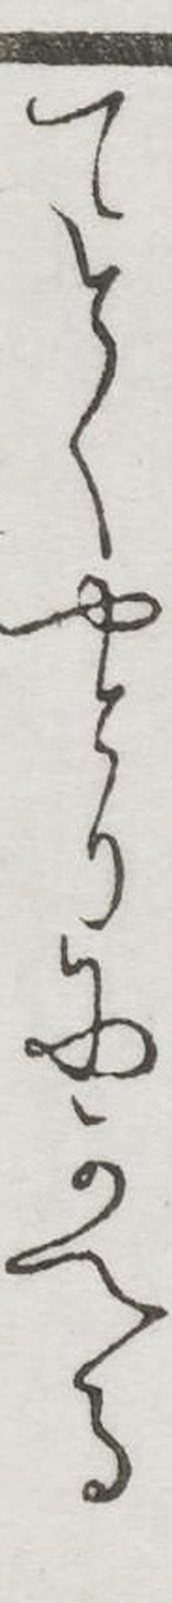てとくやとりにかへる
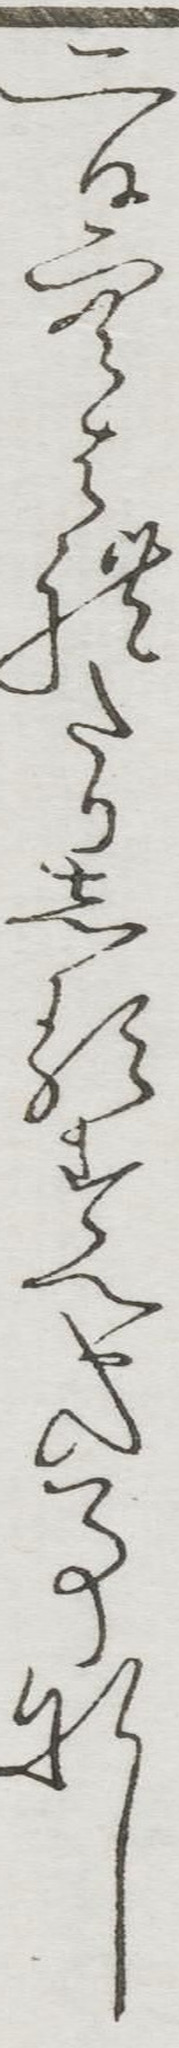二日空はれたりしるすへき事なし
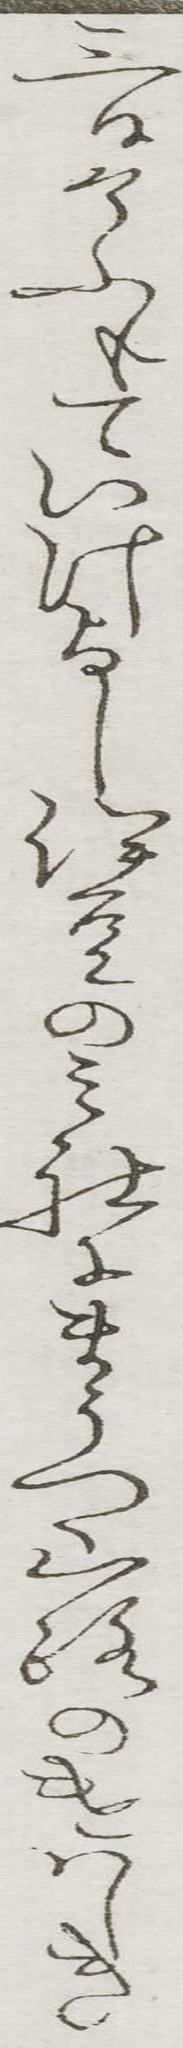三日けふもていけよし伊豆のみ社にまうつ山路のけはしき
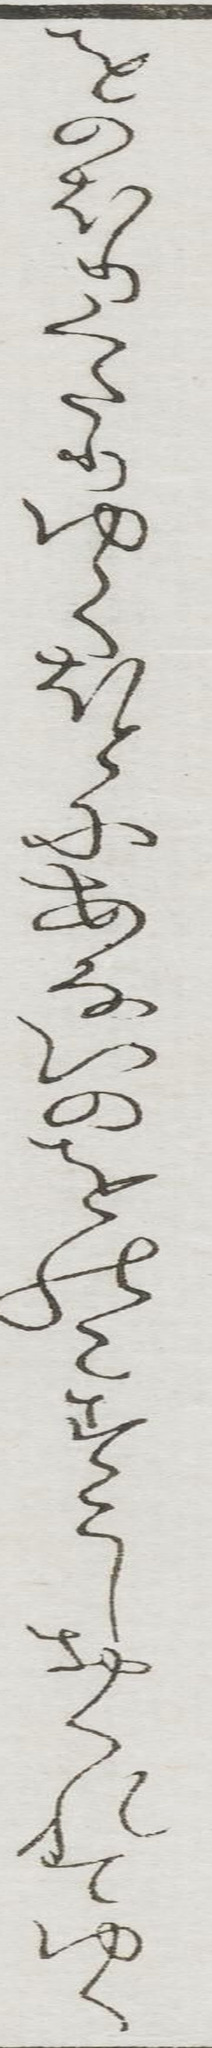をのほりくたりゆくほとにあないのをこすこしおくれてゆく
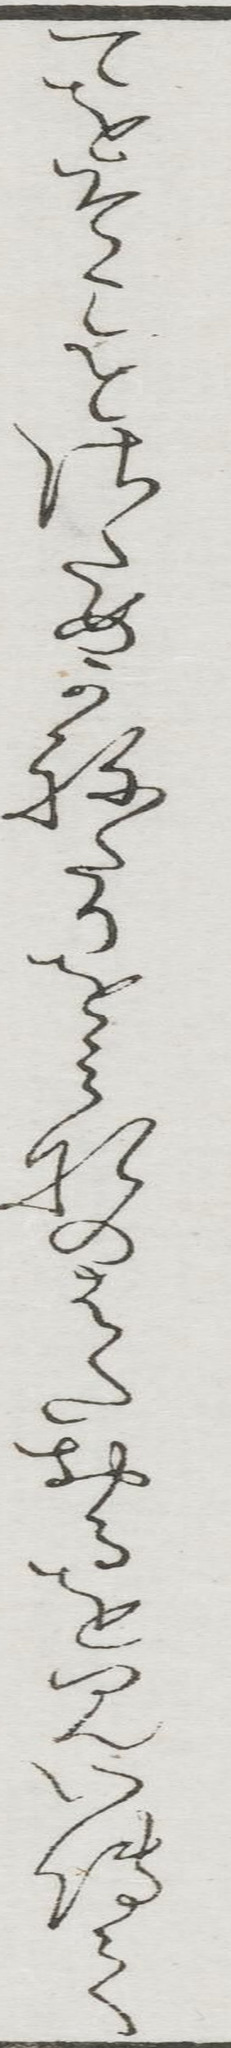てをそことさためかねたりをみなのはたおるを見いてて
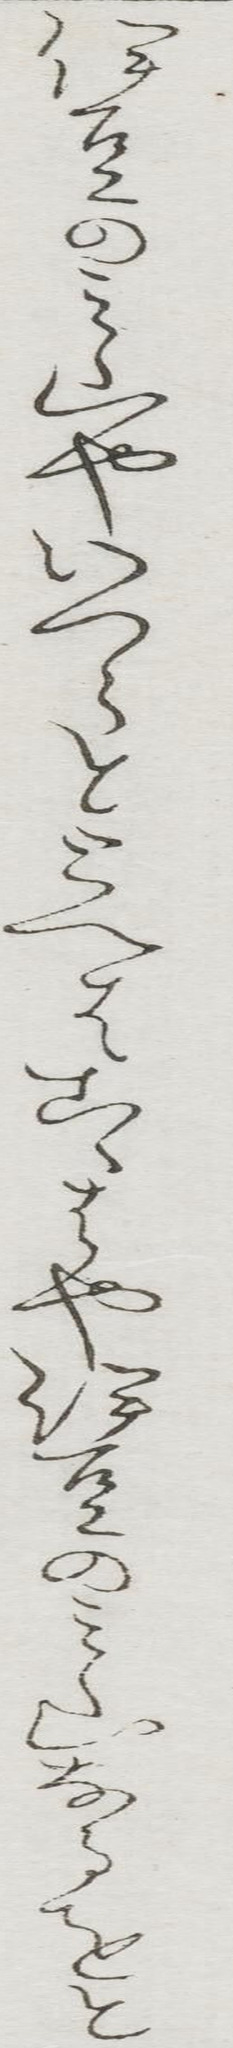伊豆のみ山やいつらととへはこゝはや伊豆のみ山なるをと
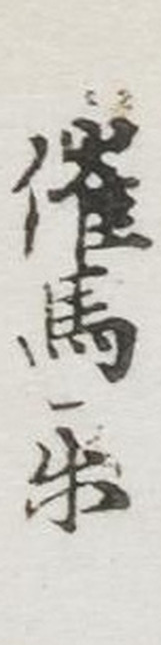催馬楽
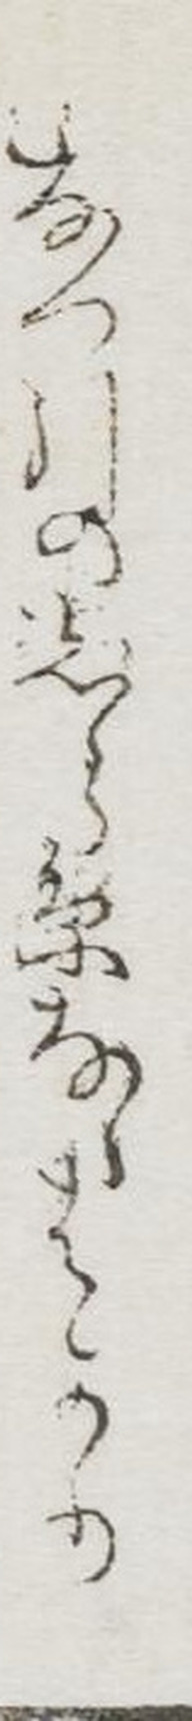なつ引のしら糸なみはかり
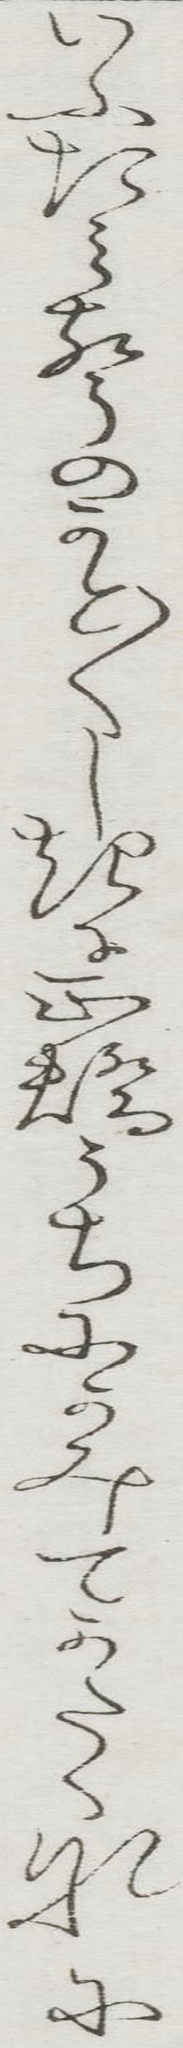いふたみ聲のかと〳〵しきに正矯うちにかみてかたくなに
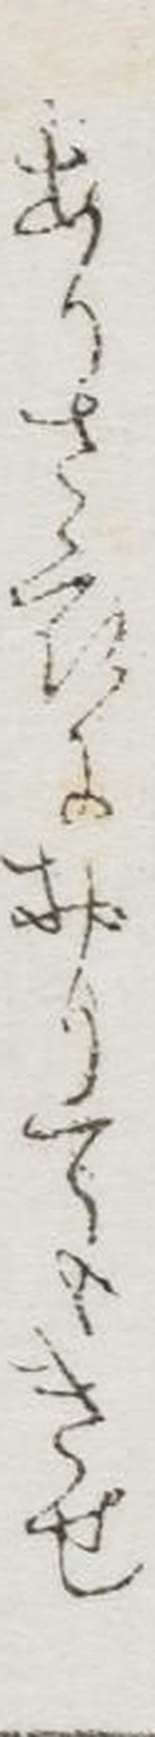ありさ衣におりてもきせ
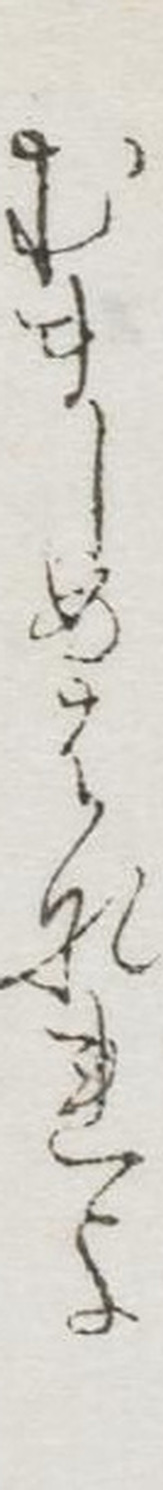むましめはなれよ
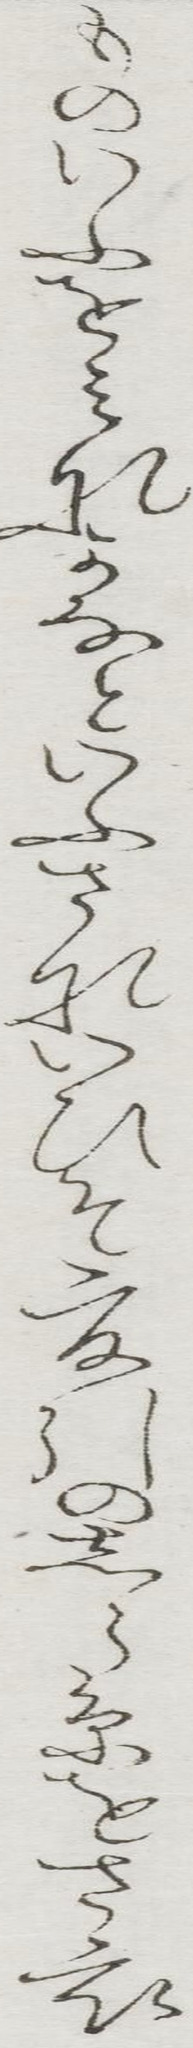ものいふをみなかなといふさないひそ夏引のしら糸をさ衣
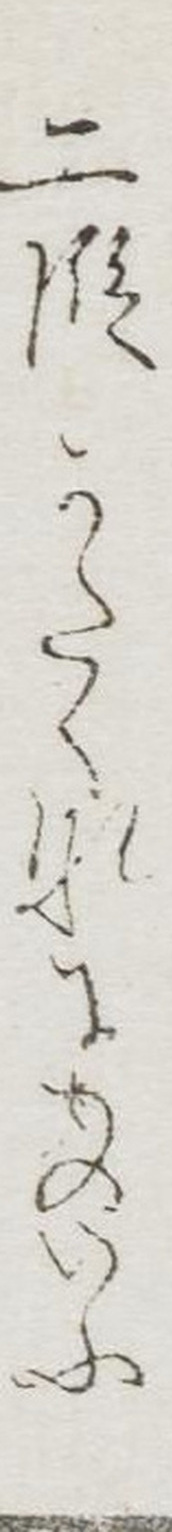二段かたくなにものいふ
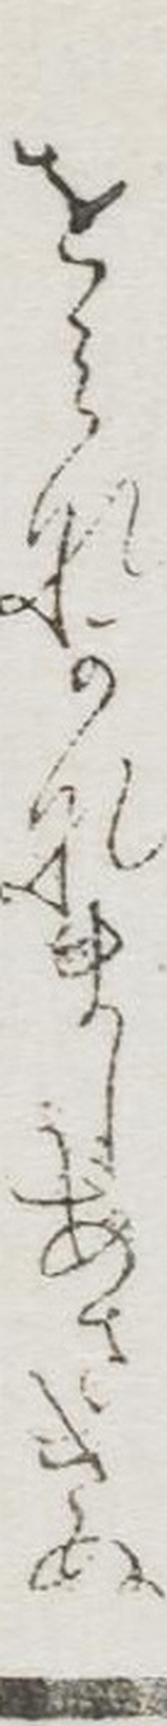をみなかなましあさきぬ
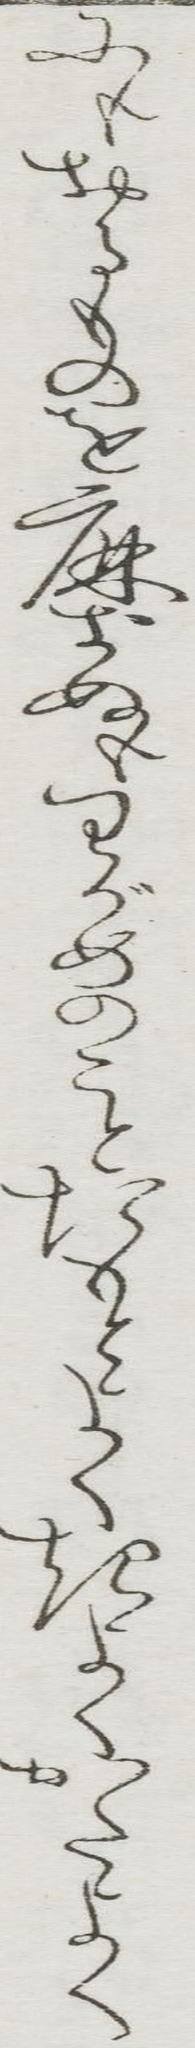にもおるものを麻きぬもわがめのことたもとよくきよくかたよく
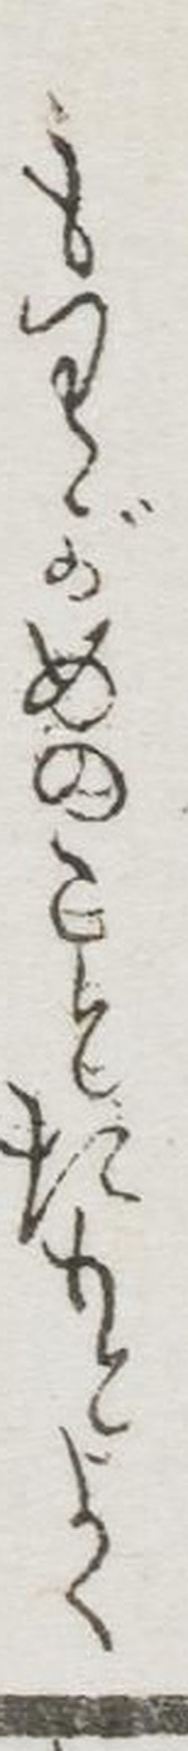もわがめのことたもとよく
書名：挿画熱海日記　全
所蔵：東京大学地震研究所図書室 Earthquake Research Institute Library, The University of Tokyo, JAPAN
